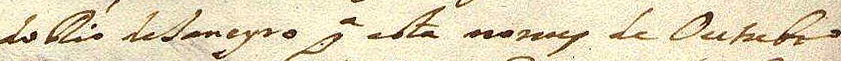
do Rio de Ianeyro pa esta no mes de Outubro
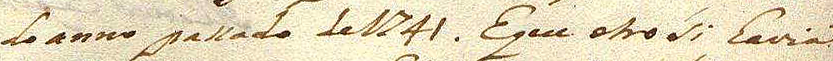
do anno passado de 1741. E que outrosi, havia
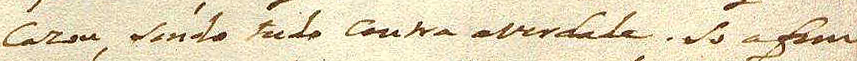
cazou, sendo tudo contra a verdade so a fim
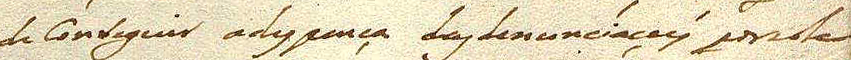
de Conseguir a despença das denunciaçoés por este
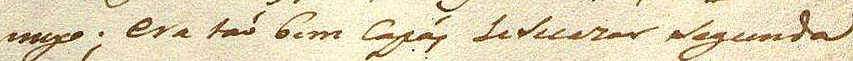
meyo; era taõbem capás de secazar segunda
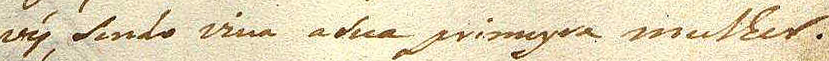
vés, sendo viua a sua primeyra mulher.
